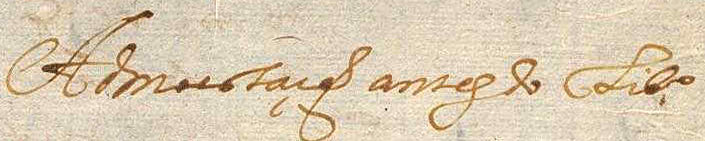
Admoestaçaõ antes do Lib.o
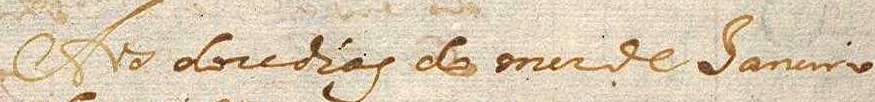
Aos doze dias do mez de Ianeiro
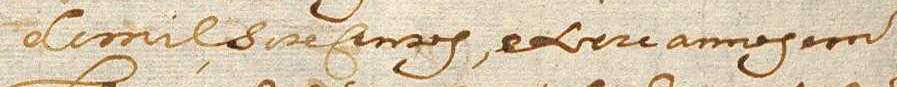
de mil, seteCentos, e treze annos em
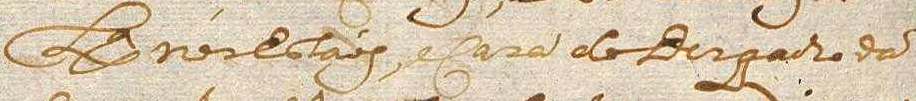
Lxa nos Estaos, e Caza do Despacho da
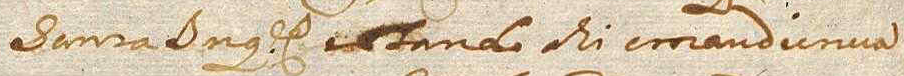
Santa Inq.çaõ estando ahi em audiencia
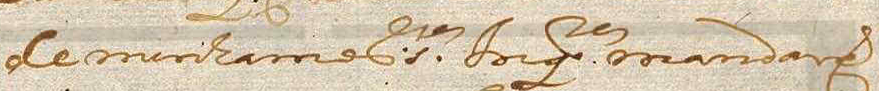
de menham os. s.ores Inq.res mandaraõ
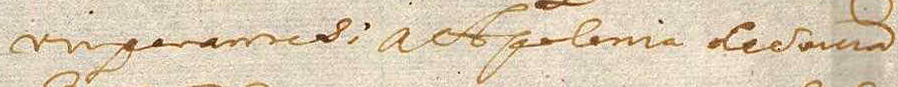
vir perante si a Apelonia de Souza
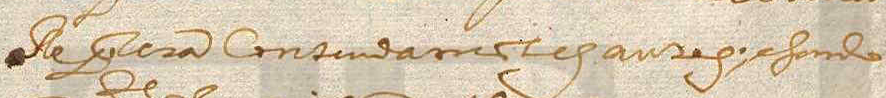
Re preza conteuda nestes autos; e sendo
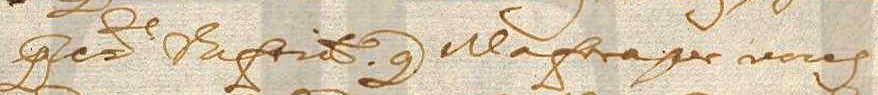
prezte lhe foi d̄o. q̄ ella fora per vezes
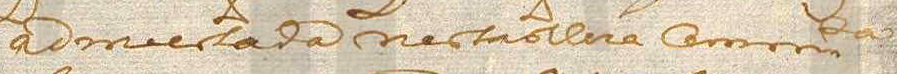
admoestada nesta Meza com mta
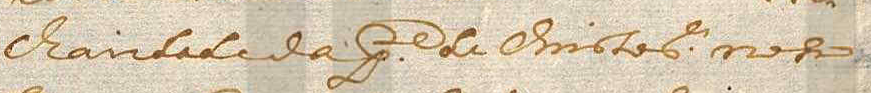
charidade da p.te de christo s.or nosso
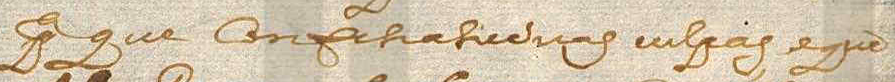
pa que confessasse suas culpas, e que
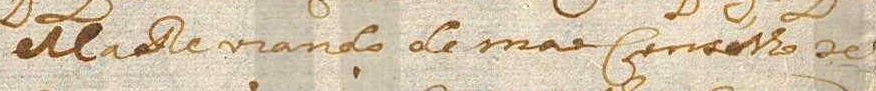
ella Re vzando de mao Conselho te
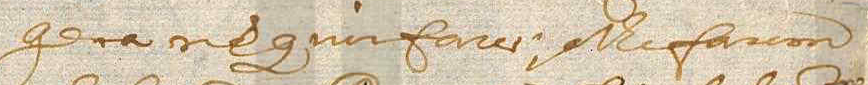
gora naõ quis fazer; e lhe fazem
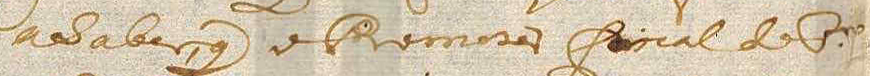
a Saber, q̄ o Promotor fiscal do s.to
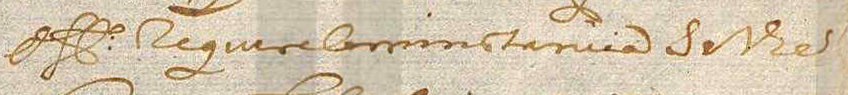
Off.o Requere com instancia se lhe
